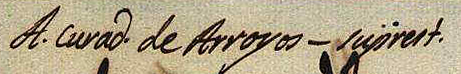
A. curad. de Arroyos = suprest.
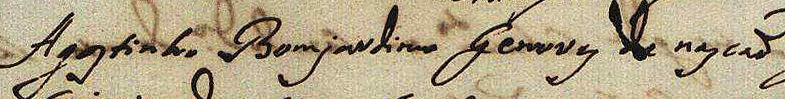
Agostinho Bomjardino Genoves de nascaõ
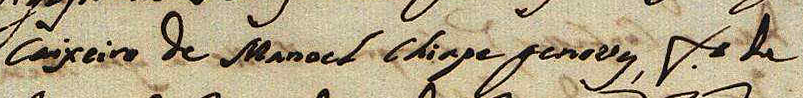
caixeiro de Manoel Chiape genoves, f.o de
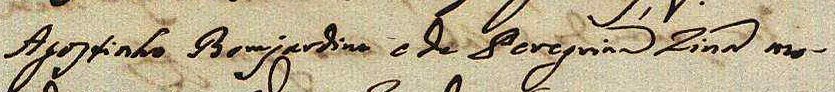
Agostinho Bomjardino e de Peregrina Zina mo
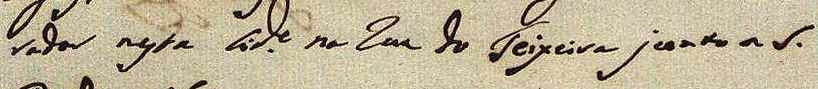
rador nesta Cid.e na Rua do Teixeira junto a S.
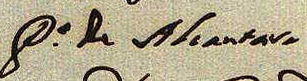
P.o de Alcantara
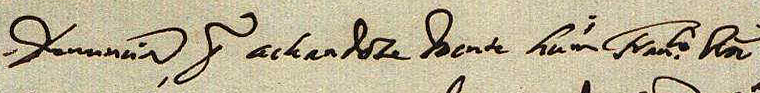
Dennuncia q̄ achandoze doente hum Fran.co Roz̄
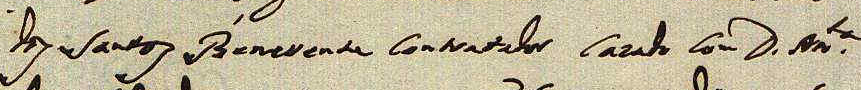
dos Santos Benevente Contratador Cazado Com D. An.ta
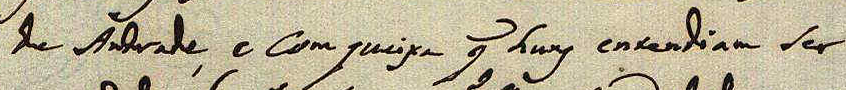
de Andrade, e com queixa q̄ huns entendiam ser
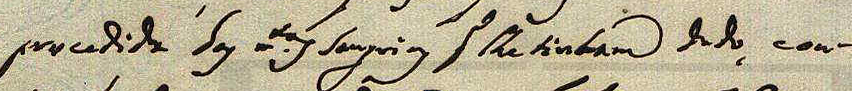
procedida das m.tas sangrias q̄ lhe tinham dado, e ou
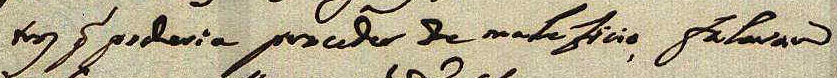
tros q̄ poderia proceder de maleficio, falaram
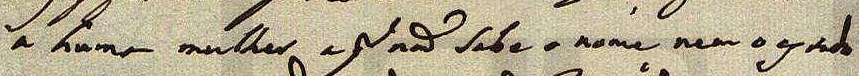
a huma mulher a q̄ naõ sabe o nome, nem o estado
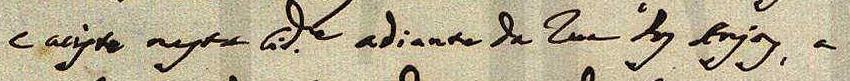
e aciste nesta Cid.e adiante da Rua dos Anjos a
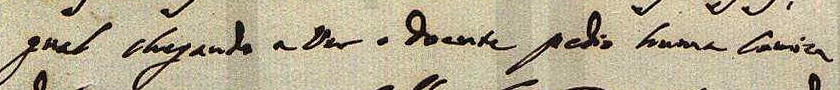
qual chegando a ver o doente pedio huma Camiza
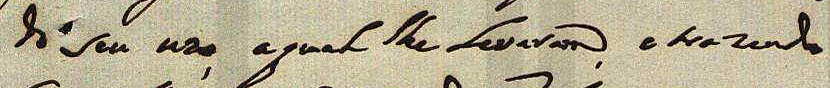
do seu uzo, a qual lhe Levaram, e trazendo
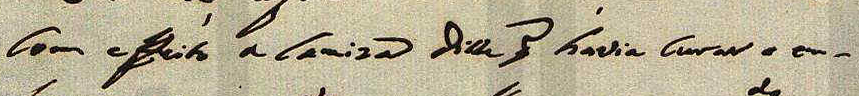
Com effeito a Camiza disse q̄ havia curar o en
